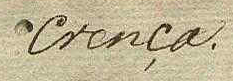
Crença.
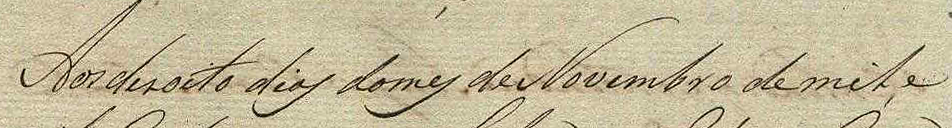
Aos dezoito dias do mes de Novembro de mil, e
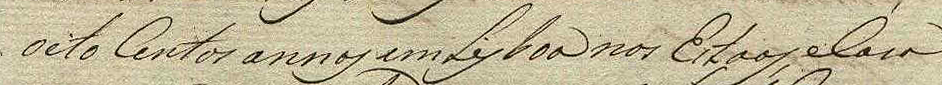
oitoCentos annos em Lisboa nos Estaos e Caza
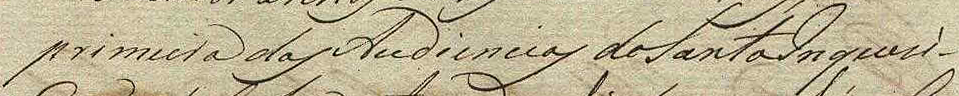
primeira das Audiencias da Santa Inquizi
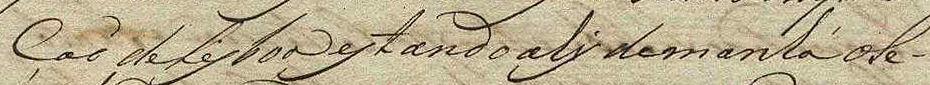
Çaõ de Lisboa estando ahy de manhã o Se
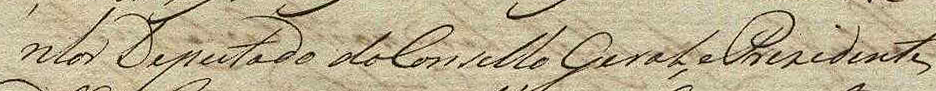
nhor Deputado do Conselho Geral, e Prezidente
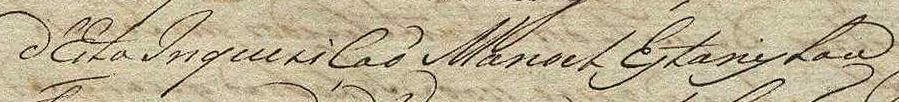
d'Esta InqueziÇaõ Manoel EstanisLau
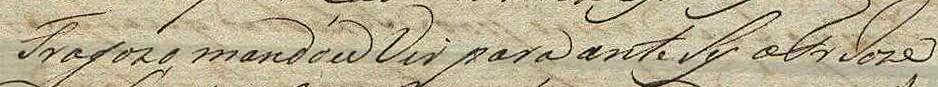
Fragozo mandou Vir para ante Sy a Fr Ioze
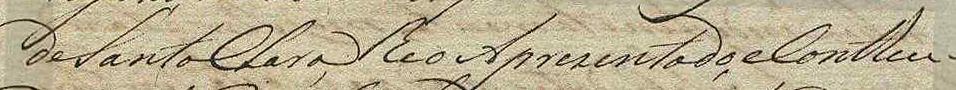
de Santa Clara Reo Aprezentado, e Contheu
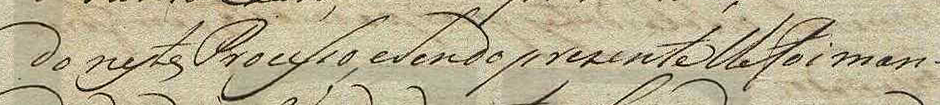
do neste Processo e sendo prezente lhe foi man
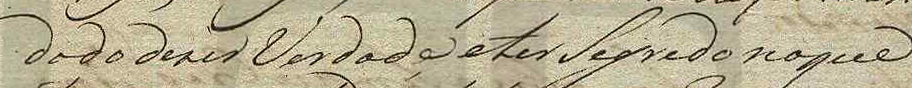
dado dizer Verdade, e ter Segredo no que
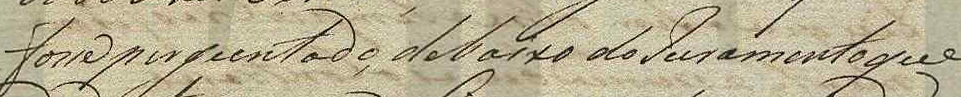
fosse perguntado, debaixo do Iuramento que
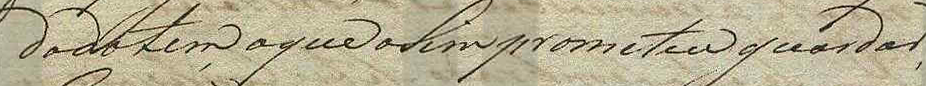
dado tem, o que aSim prometeu guardar,
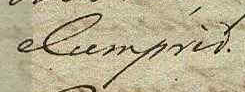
e Cumprir.
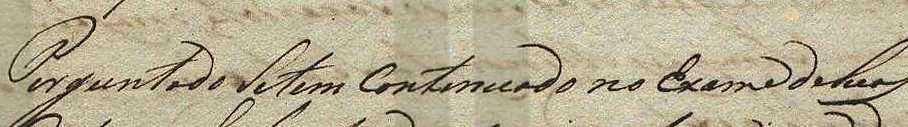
Perguntado se tem contenuado no Exame de suas
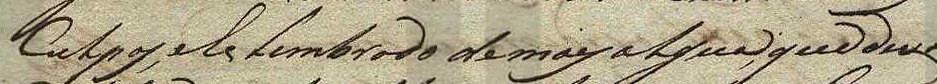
Culpas, e he Lembrado de mais algua, que deve
